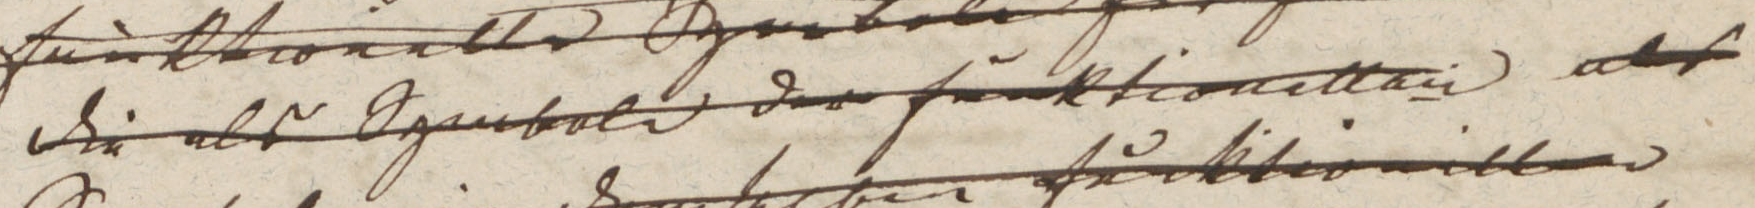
die als Symbole der funktionellen als
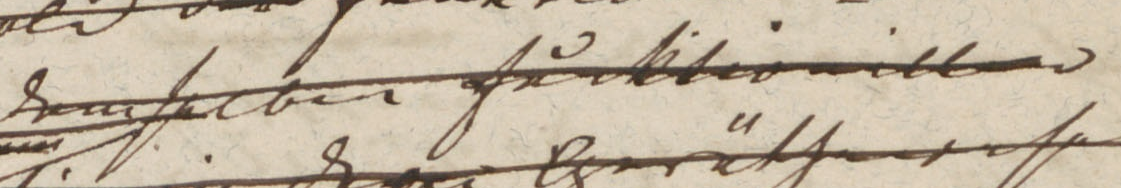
in demselben funktionellen
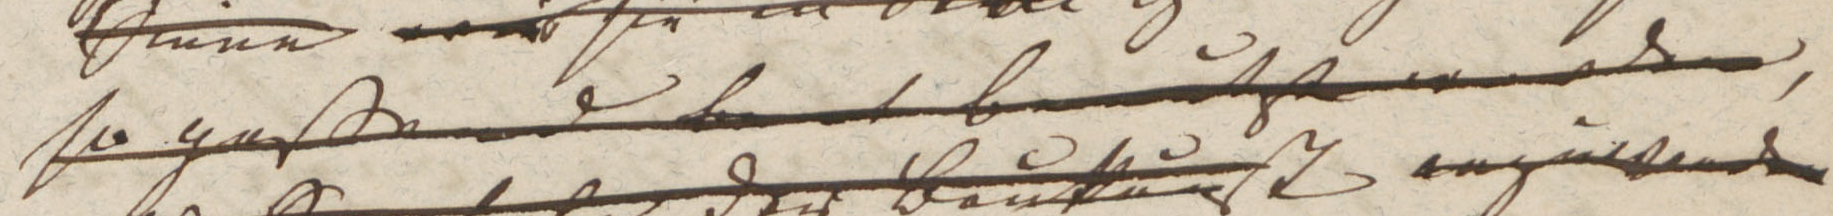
so passend benut benutzt werden,
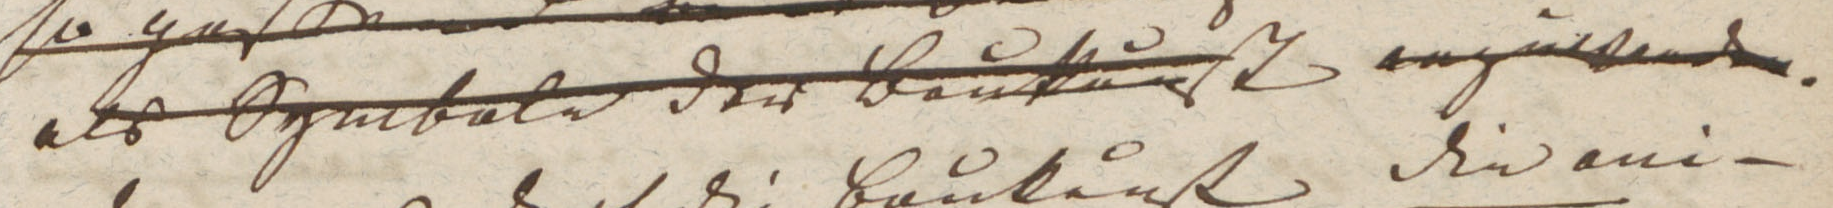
als Symbole der Baukunst anzuwenden.
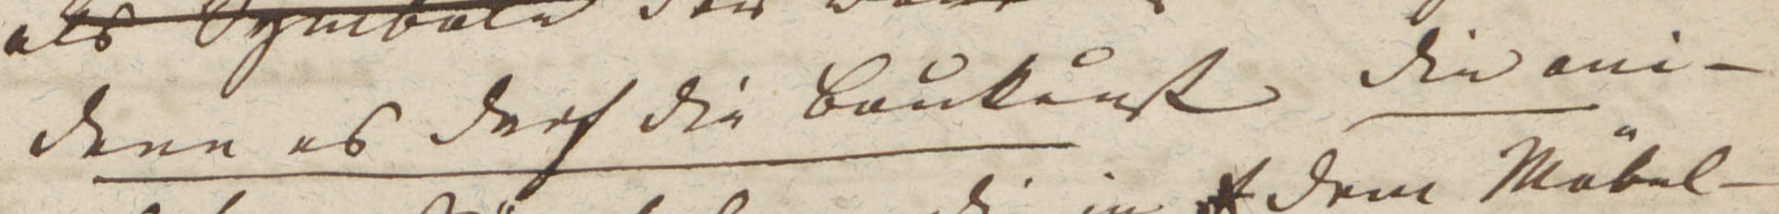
Denn es darf die Baukunst die ani-
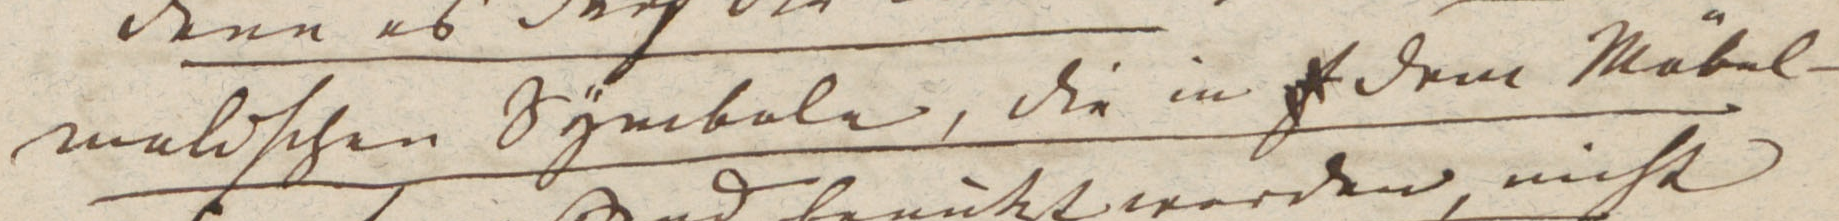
malischen Symbole, die in f dem Möbel-
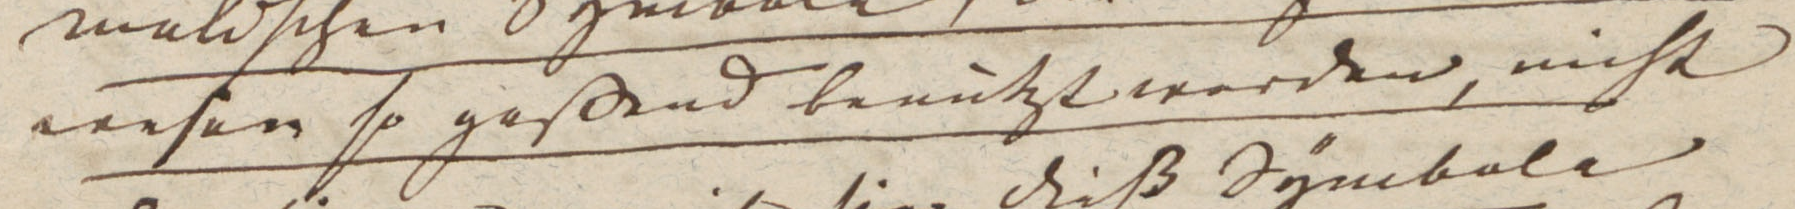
wesen so passend benützt werden, nicht
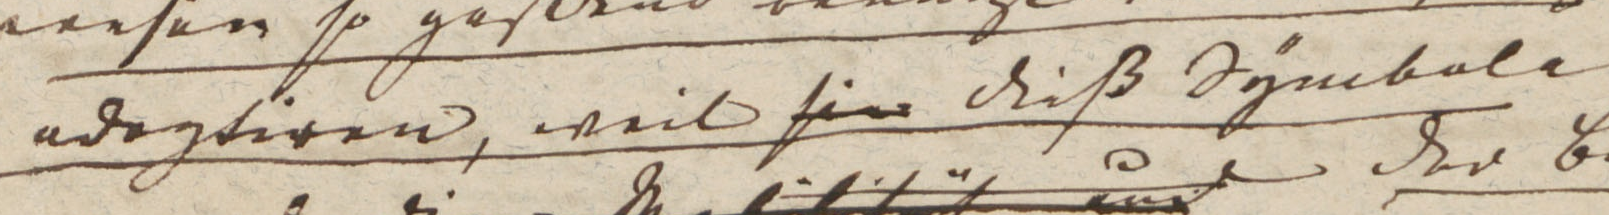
adoptiren, weil sie diess Symbole
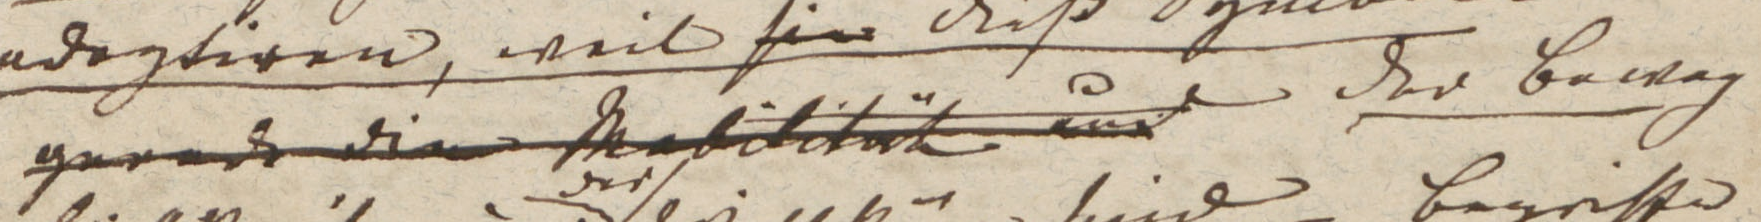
gerade dei Mobilität und der Beweg-
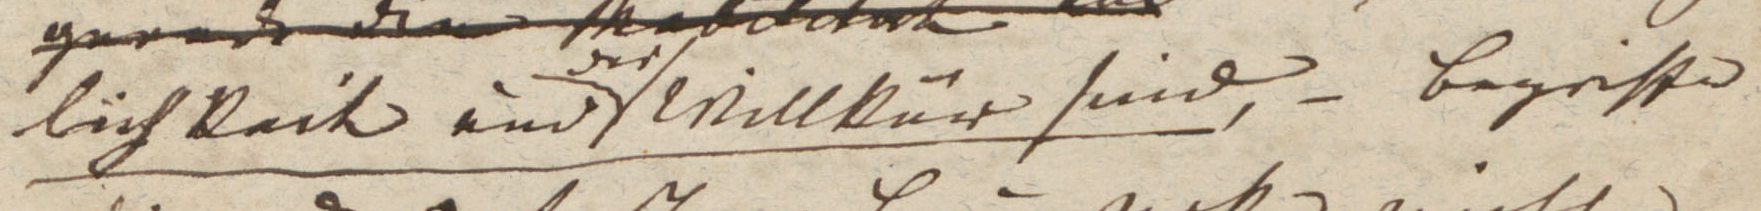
lichkeit und der Willkür sind, – Begriffe
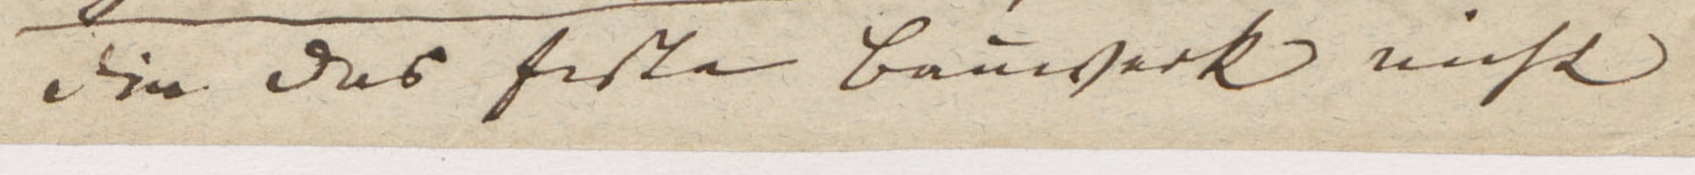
die das feste Bauwerk nicht
